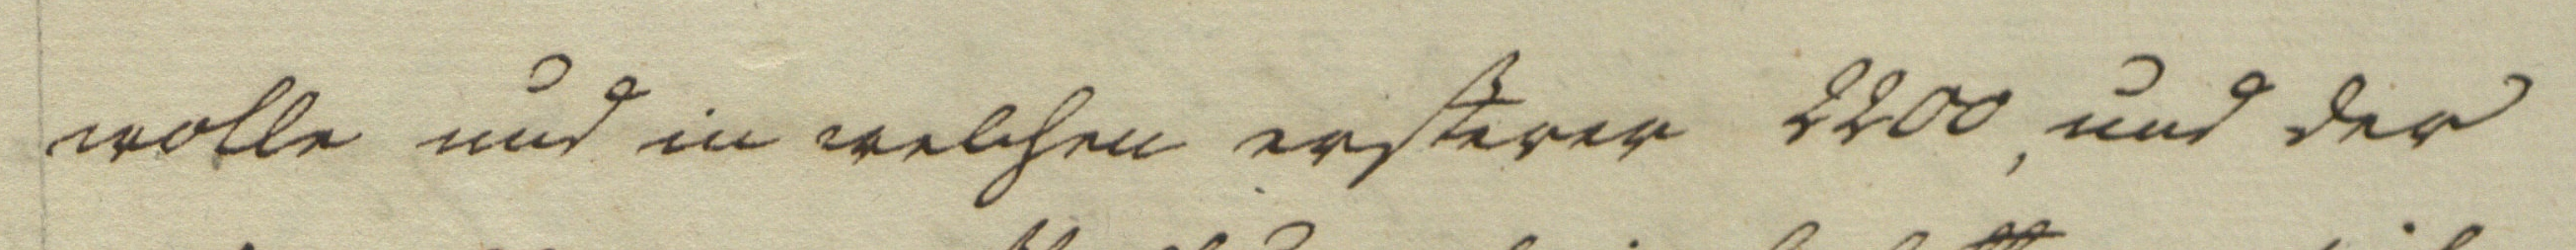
wolle und in welchen ersterer 2200, und der
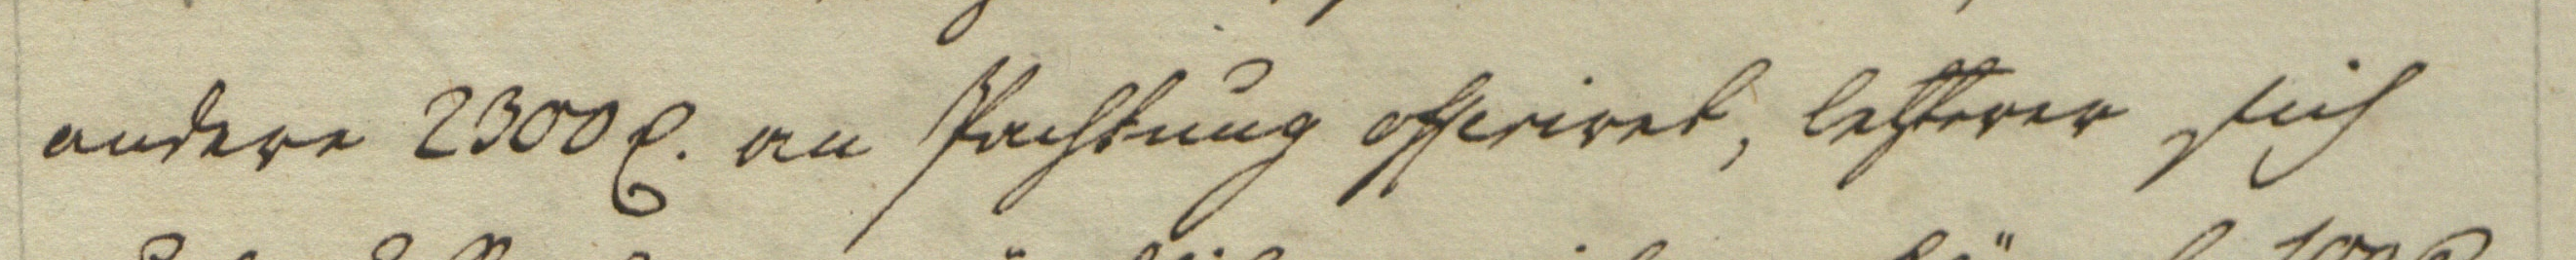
andere 2300 l. an Pachtung offeriret, letzterer sich
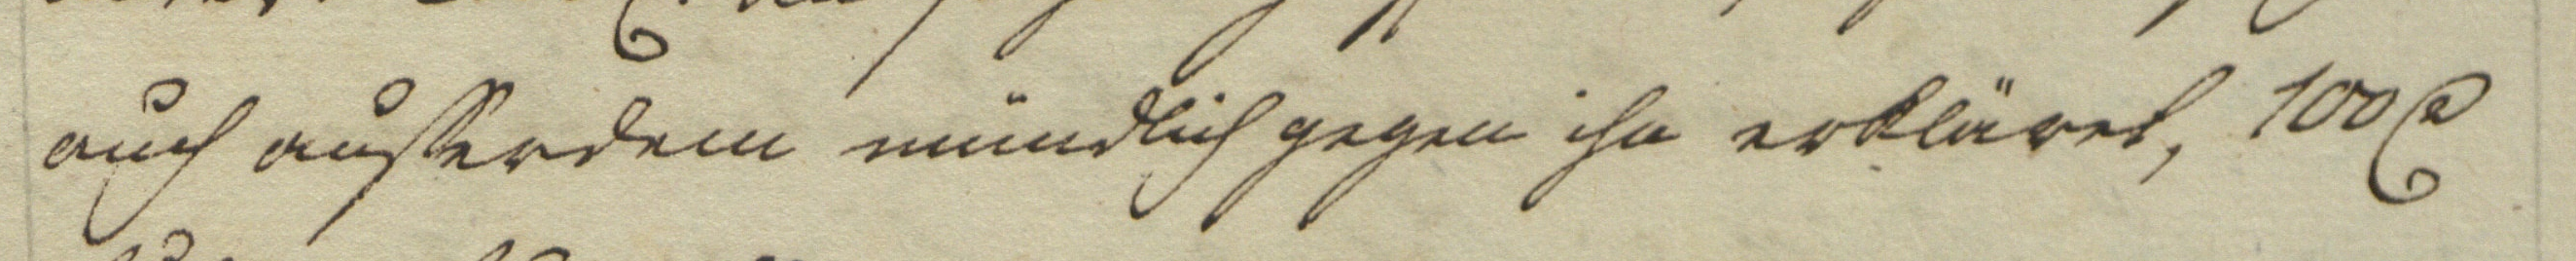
auch ausserdem mündlich gegen ihn erkläret, 100 l.
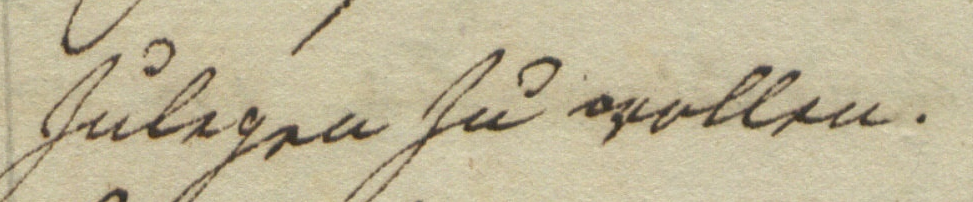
zulegen zu wollen.
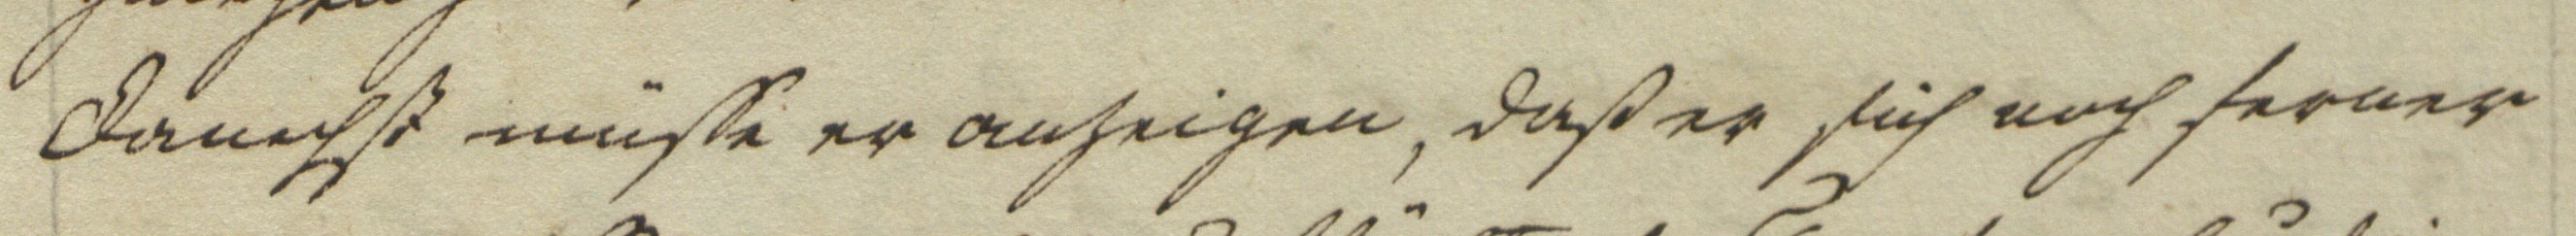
Danechst müsse er anzeigen, daß er sich noch ferner
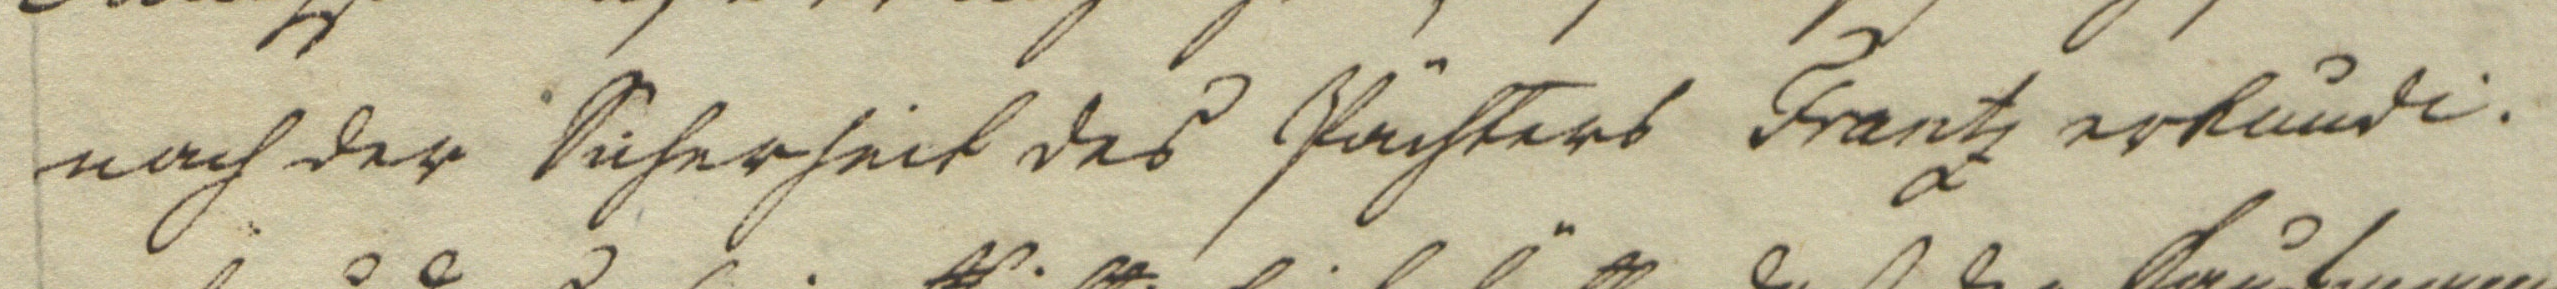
nach der Sicherheit des Pächters Frantz erkundi¬
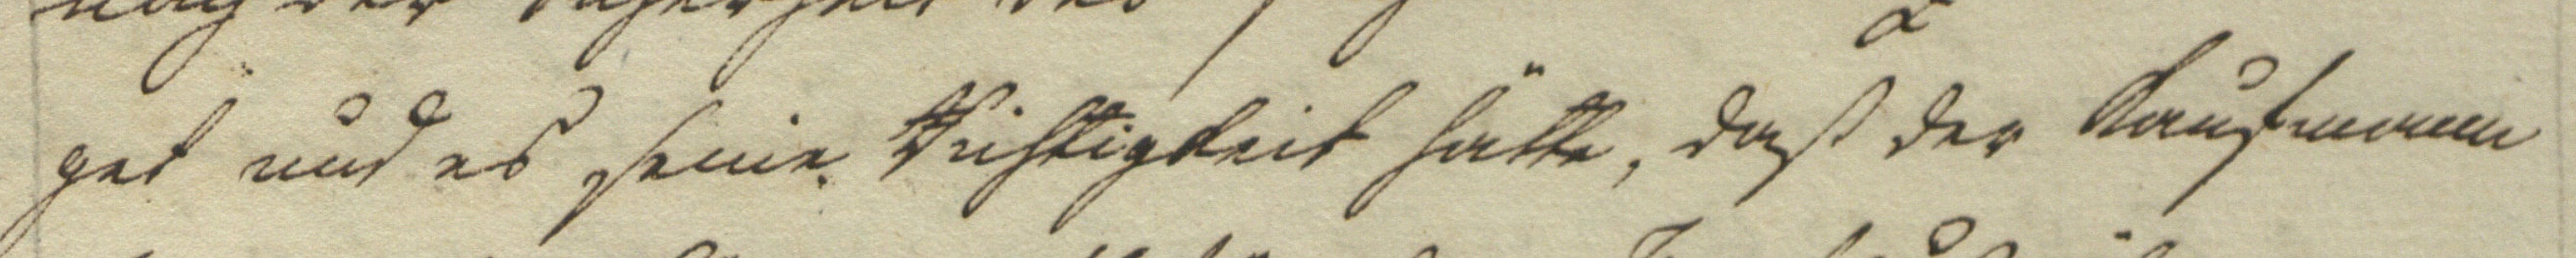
get und es seine Richtigkeit hätte, daß der Kaufmann
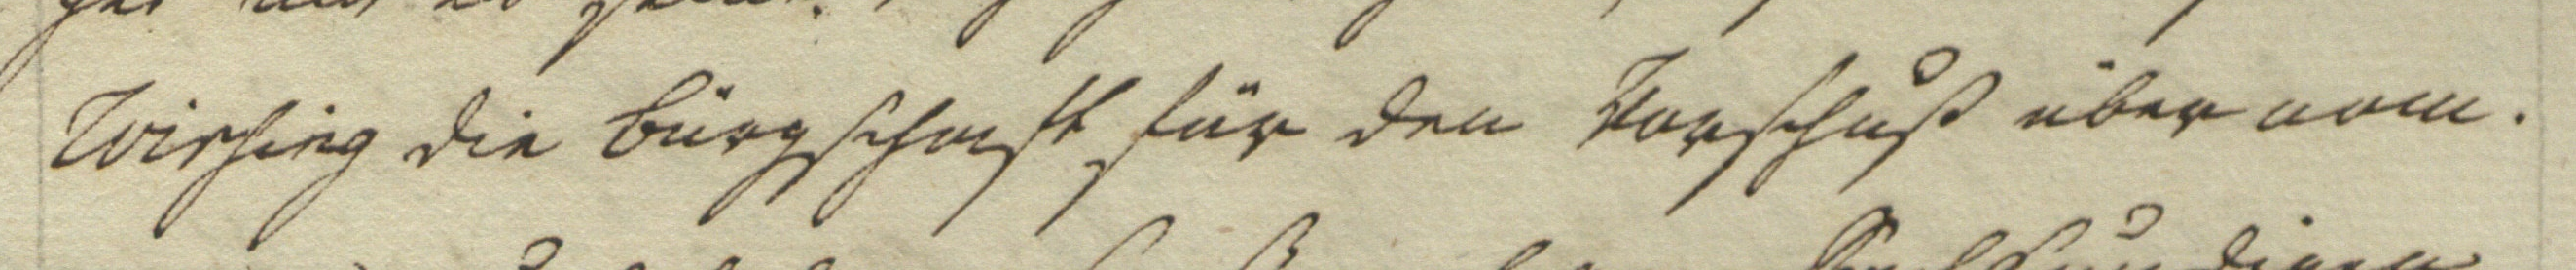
Wirsing die Bürgschaft für den Vorschuß übernom¬
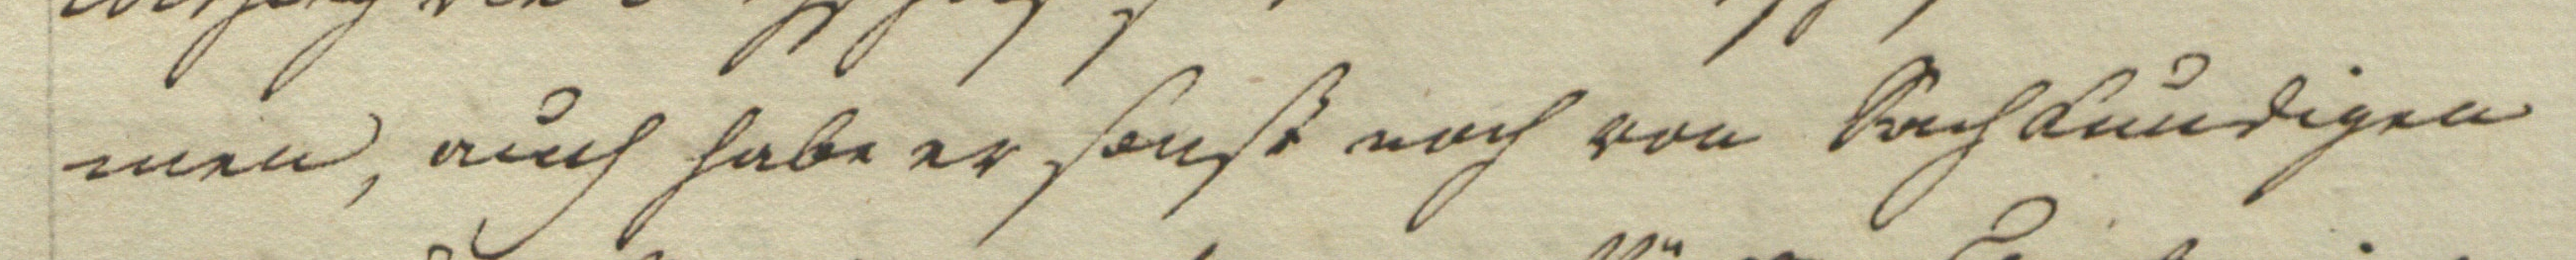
men, auch habe er sonst noch von Sachkundigen
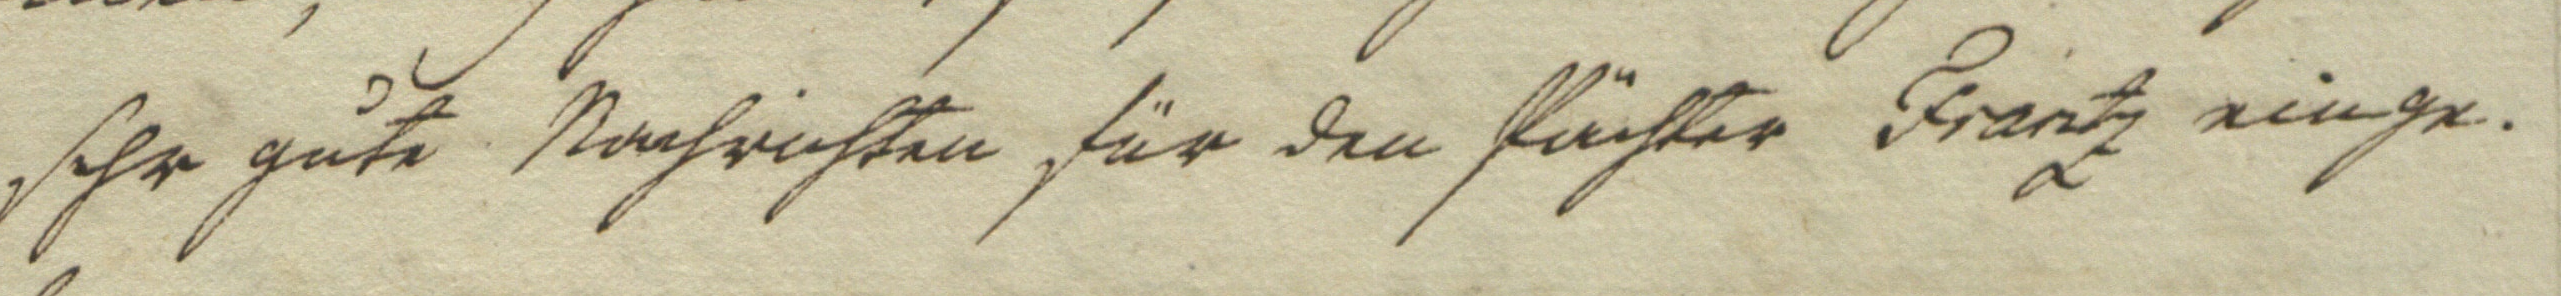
sehr gute Nachrichten für den Pächter Frantz einge¬
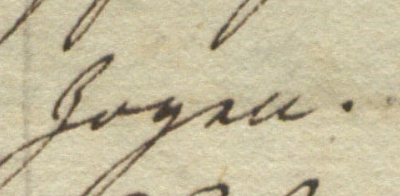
zogen.
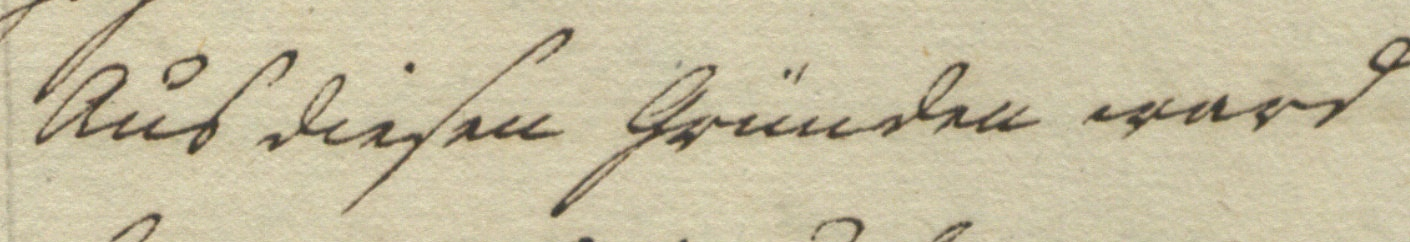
Aus diesen Gründen ward
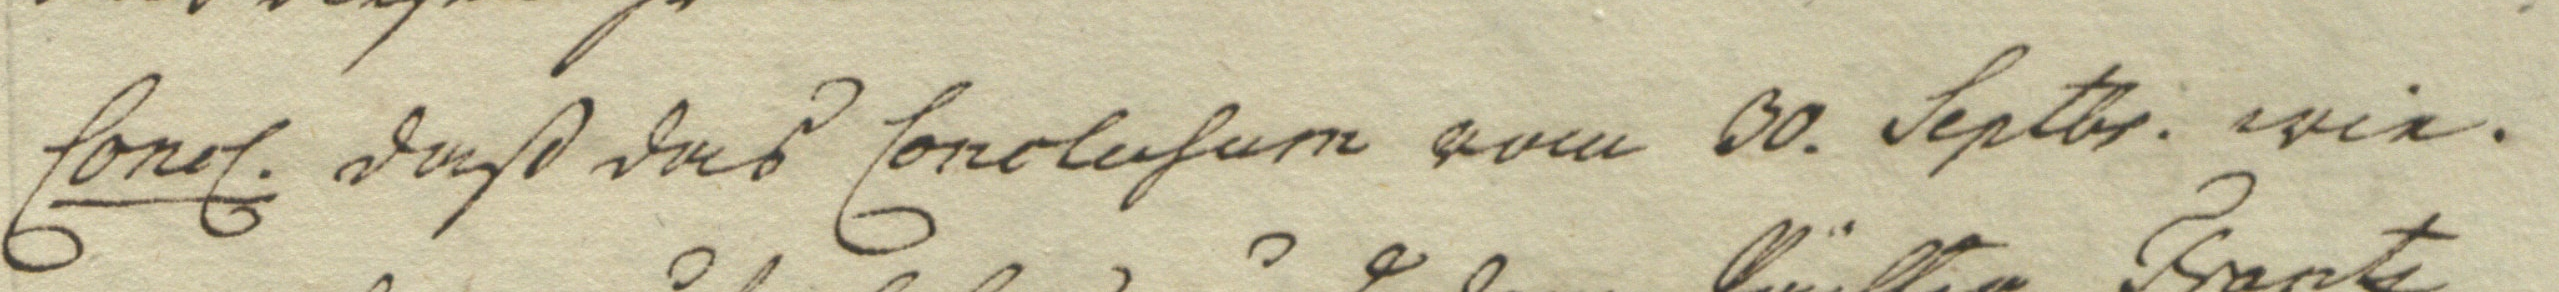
Concl. daß das Conclusum vom 30. Septbr. wie¬
